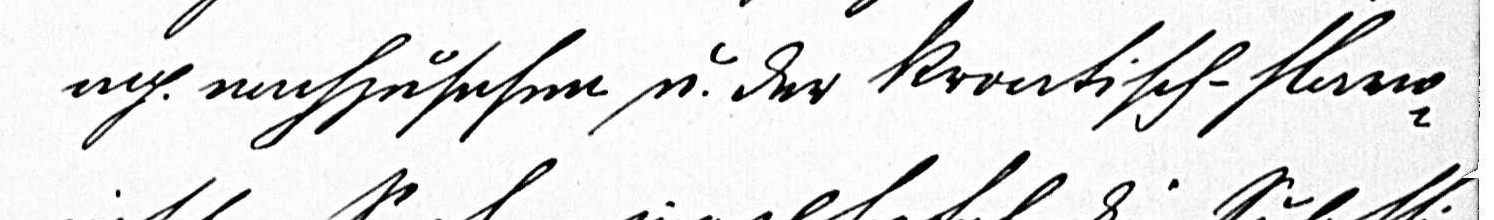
ag. nachzusehen u. der kroatisch-slavo¬
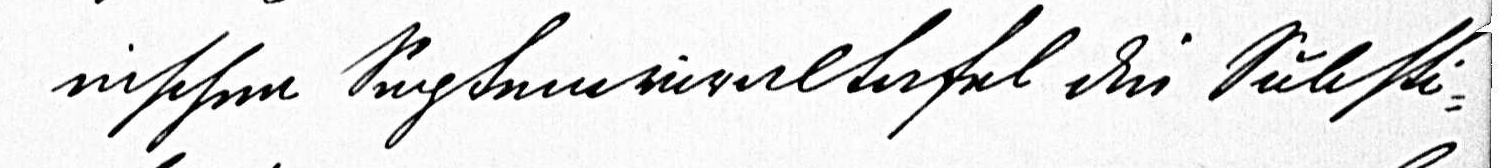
nischen Septemiraltafel die Substi¬
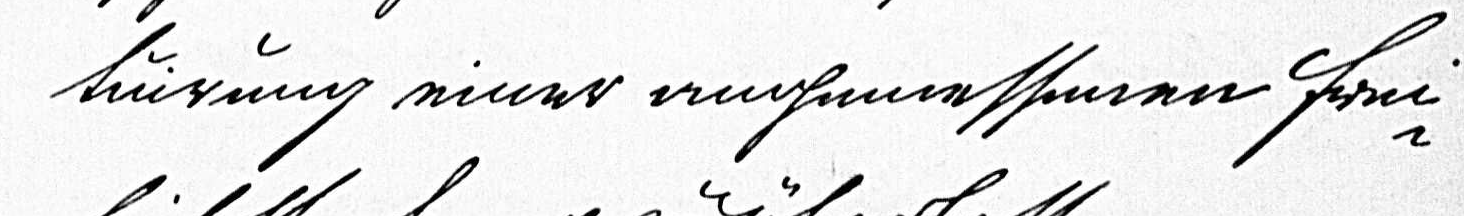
tuirung einer angemessenen Frei¬
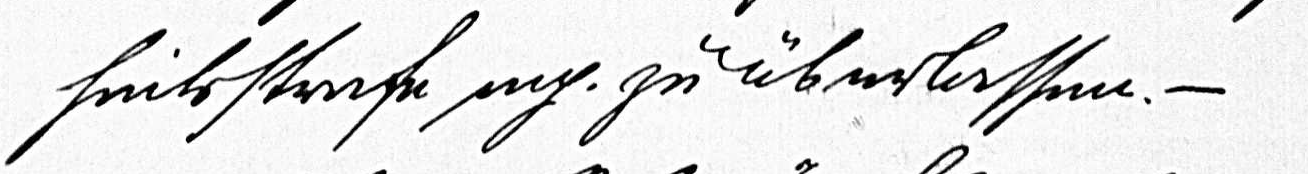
heitsstrafe ag. zu überlassen.-
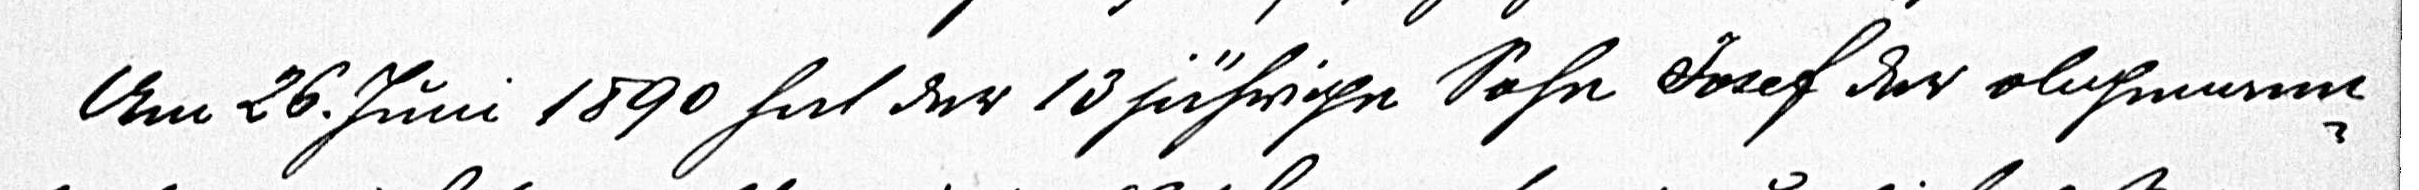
Am 26. Juni 1890 hat der 13 jährige Sohn der obgenann¬
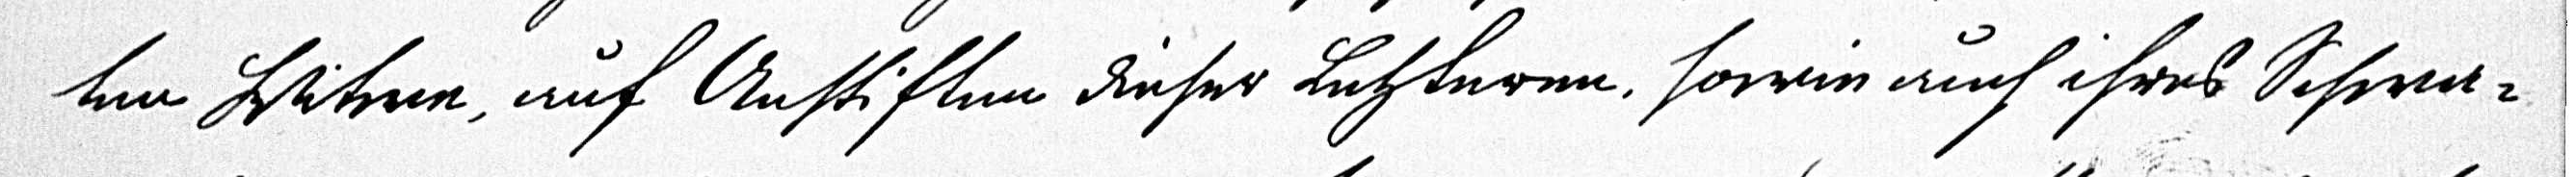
ten Witwe, auf Anstiften dieser Letzteren, sowie auch ihres Schwa¬
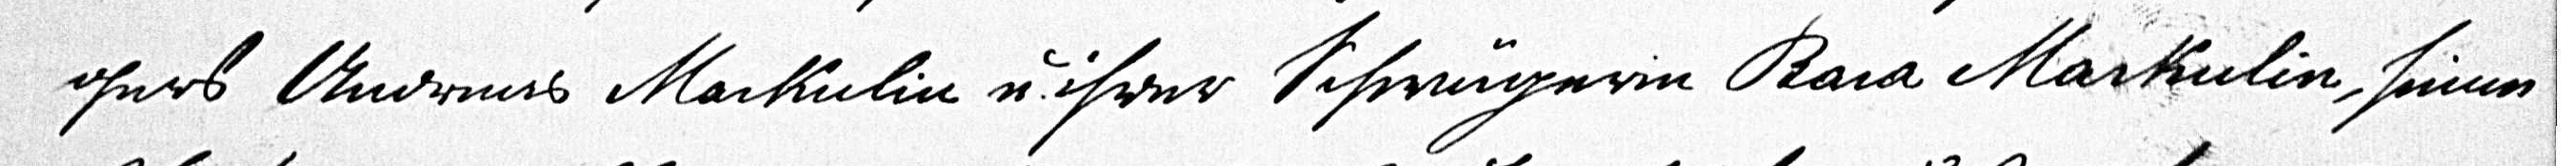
gers Andreas Markulin u. ihrer Schwürgerin Bara Markulin, seine
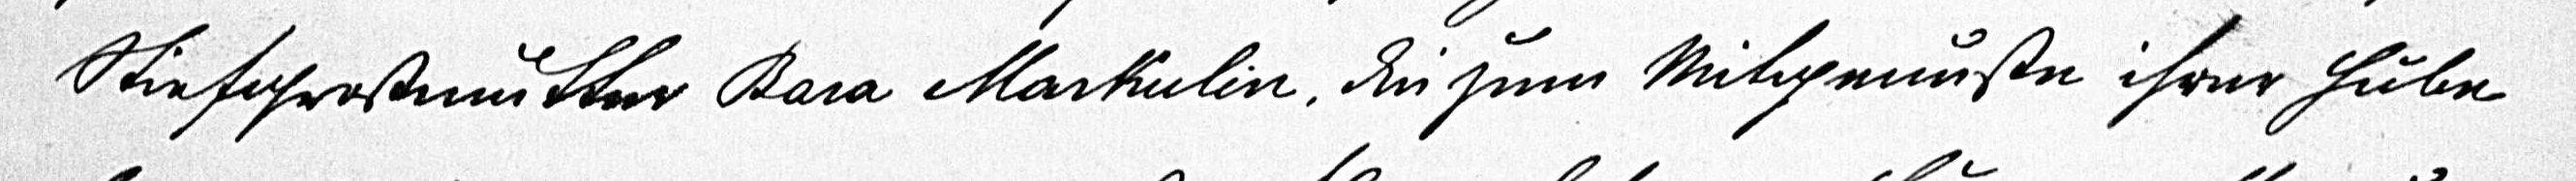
Stiefgroßmutter Bara Markulin, die zum Mitgenuße ihrer Hube
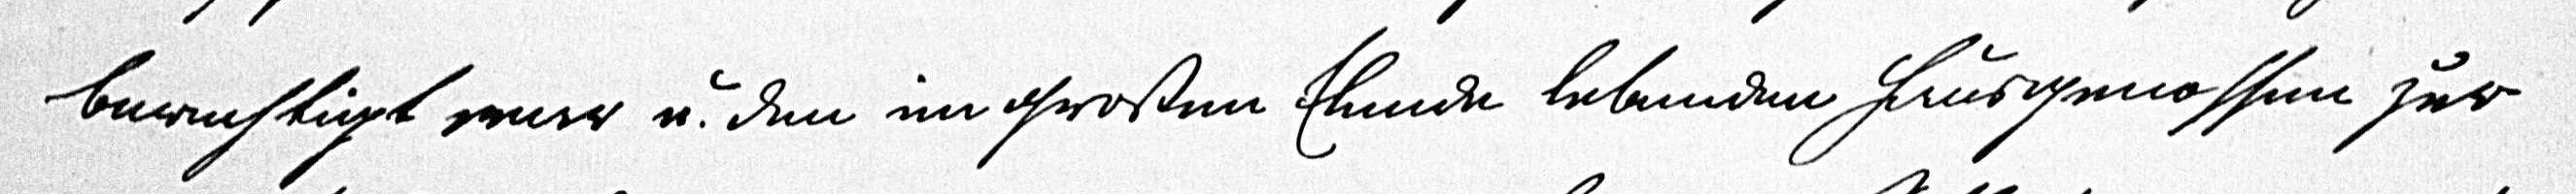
berechtigt war u. den im großen Elende lebenden Husgenossin zur
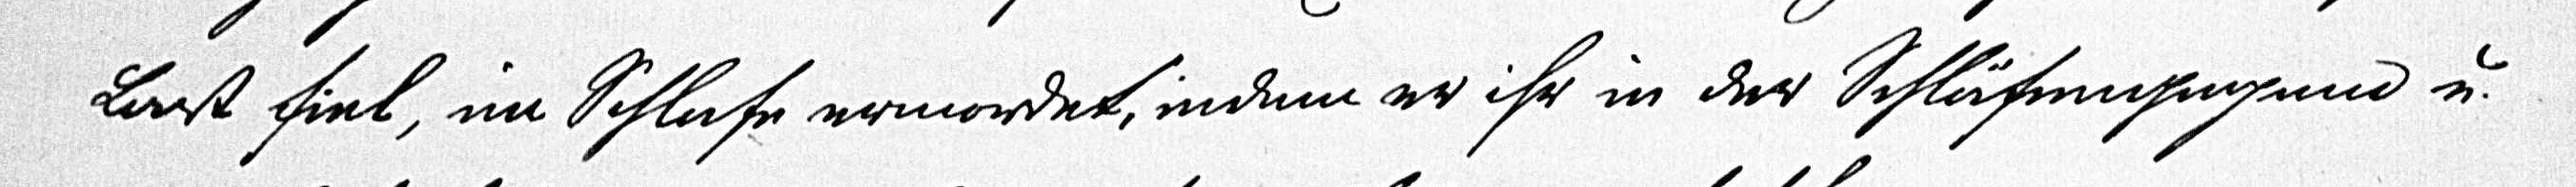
Last fiel, im Schlafe ermordet, indem er ihr in der Schläfengegend u.
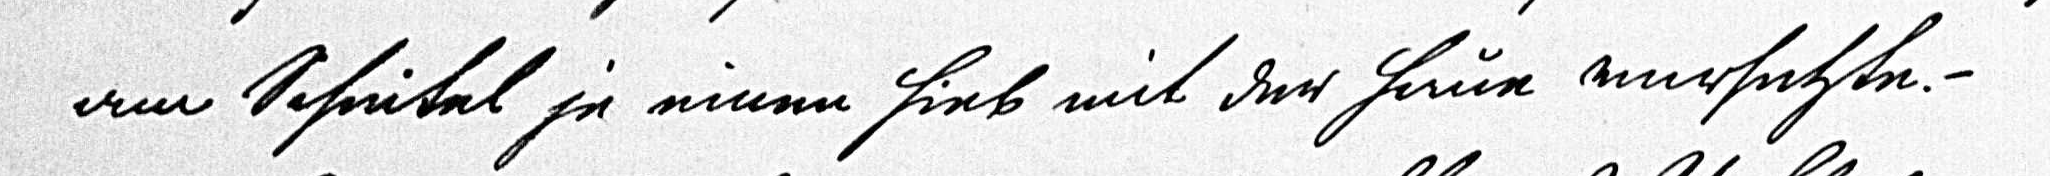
am Scheitel je einen hieb mit der Haue versetzte.-
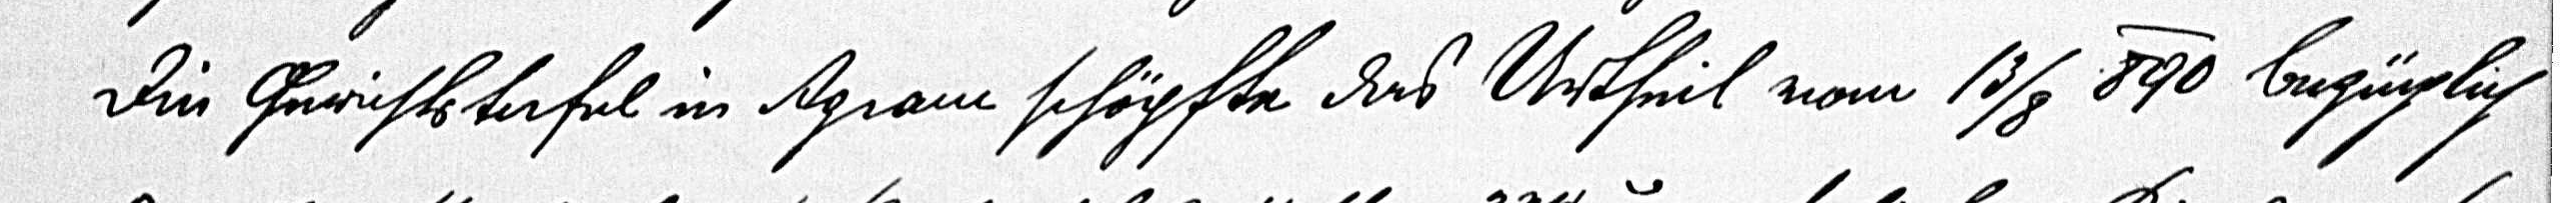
Die Gerichtstafel in Agram schöpfte des Urtheil vom 13/8 890 bezüglich
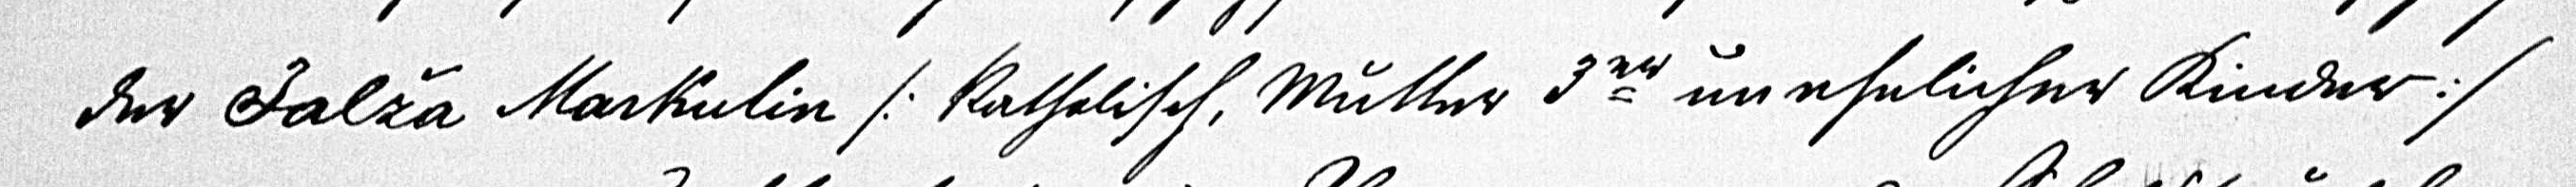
der Salža Markulin /: katholisch, Mutter 3er unehelicher Kinder :/
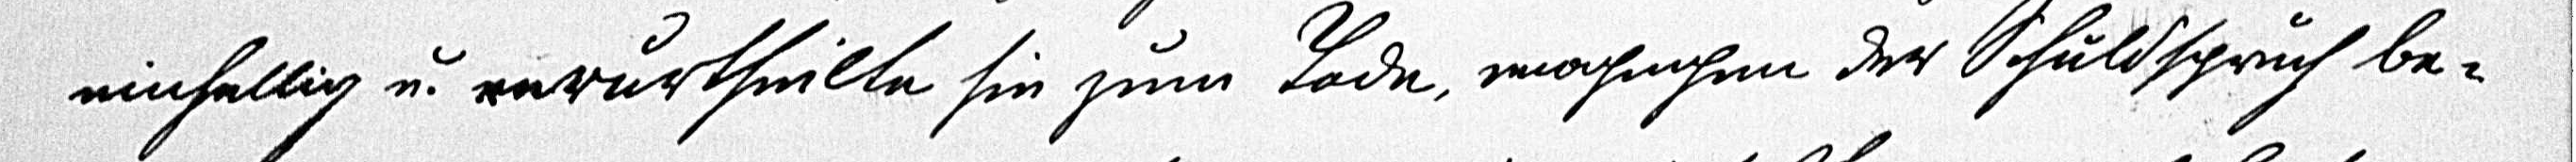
einhellig u. verurtheilte sie zum Tode, wogegen der Schuldspruch be¬
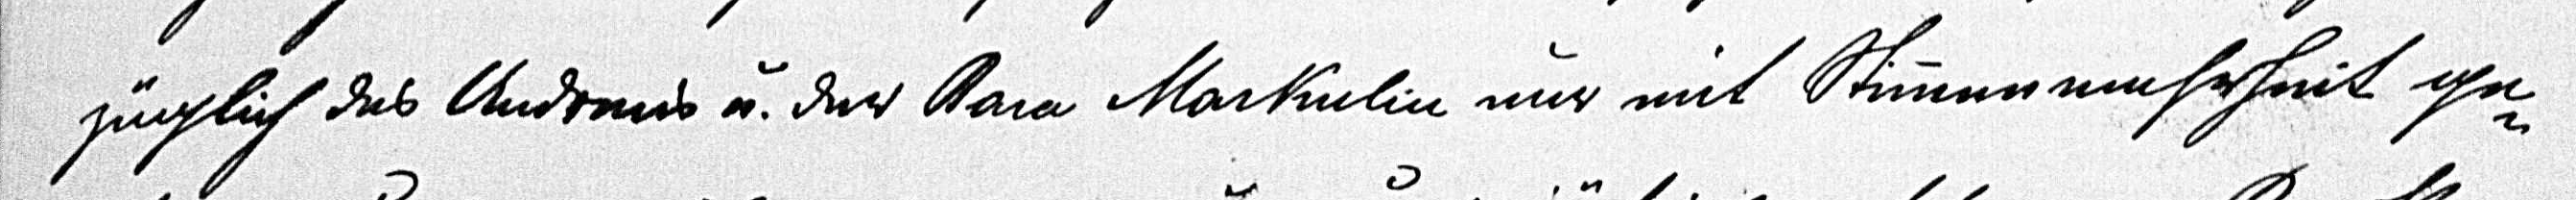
züglich des Andreas u. der Bara Markulin nur mit Stimmenmehrheit ge¬
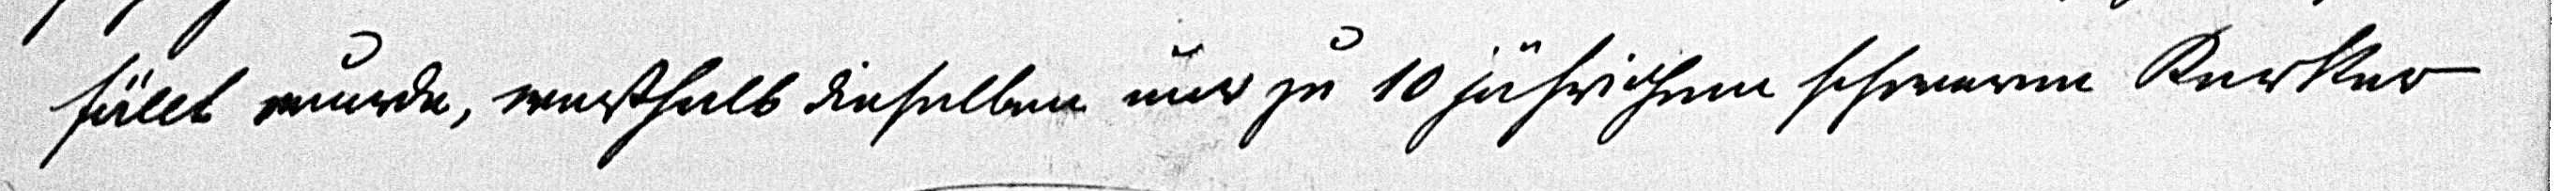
fällt wurde, xxhalb dieselben nur zu 10 jährigem schweren Kerker
